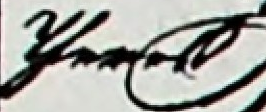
Theres
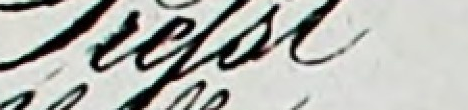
Pressl
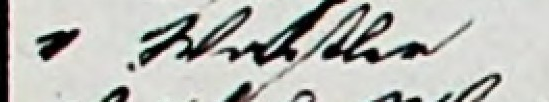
v. Wastler
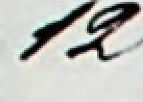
12
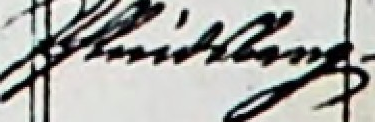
Pflindsberg
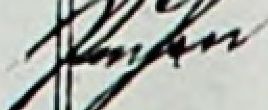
Puchen
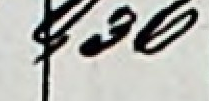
0,36
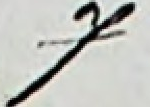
7
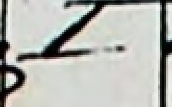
I
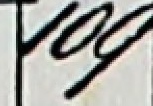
109
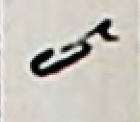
5
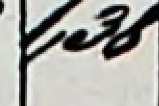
1,38
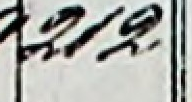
212
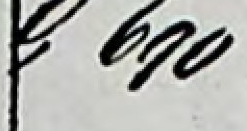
0,690
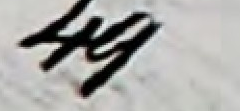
49
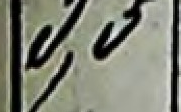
3,5
